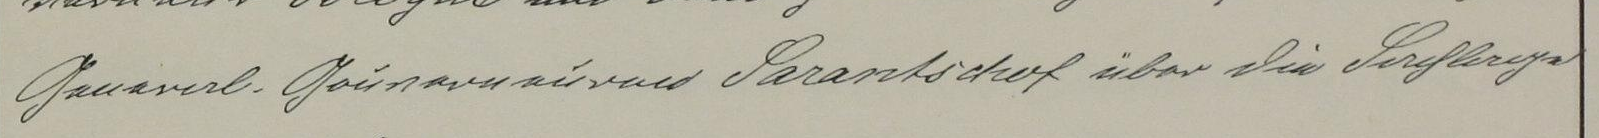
General-Gouverneuren Sarantschof über die Sachlage
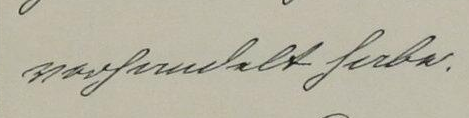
verhandelt habe.
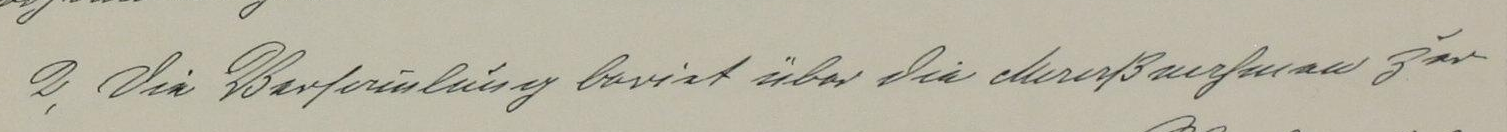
2. Die Versammlung beriet über die Maaßnahmen zur
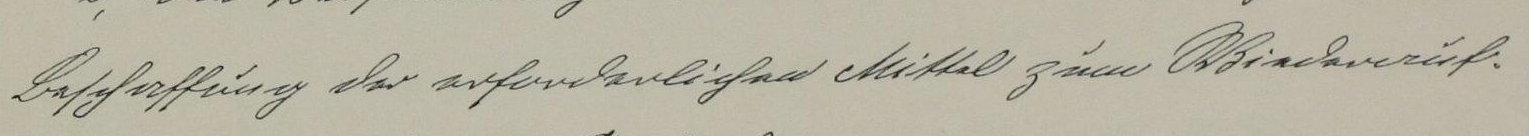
Beschaffung der erforderlichen Mittel zum Wiederauf-
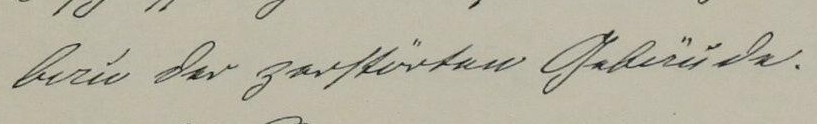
bau der zerstörten Gebäude.
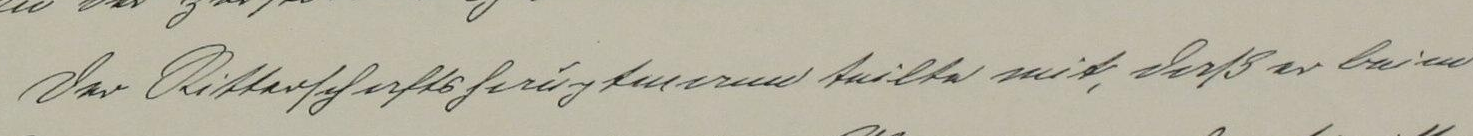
Der Ritterschaftshauptmann teilte mit, daß er beim
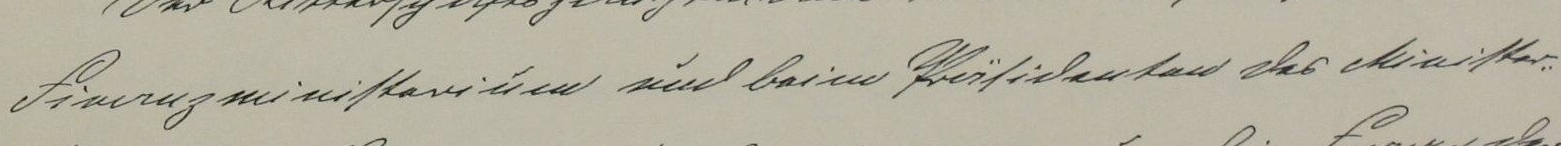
Finanzministerium und beim Präsidenten des Minister-
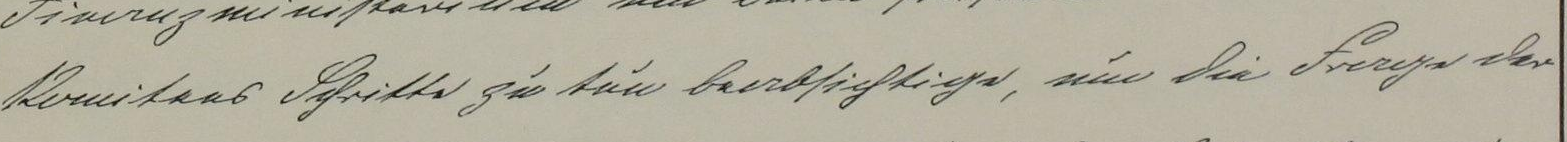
komitees Schritte zu tun beabsichtige, um die Frage der
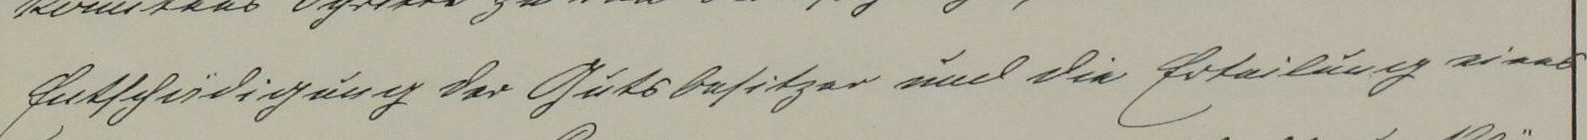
Entschädigung der Gutsbesitzer und die Erteilung eines
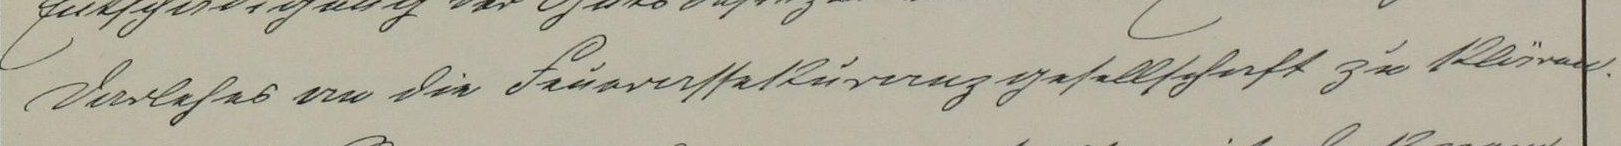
Darlehns an die Feuerassekuranzgesellschaft zu klären.
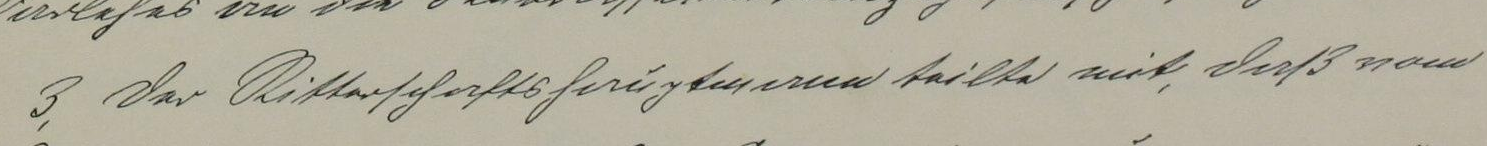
3. Der Ritterschaftshauptmann teilte mit, daß vom
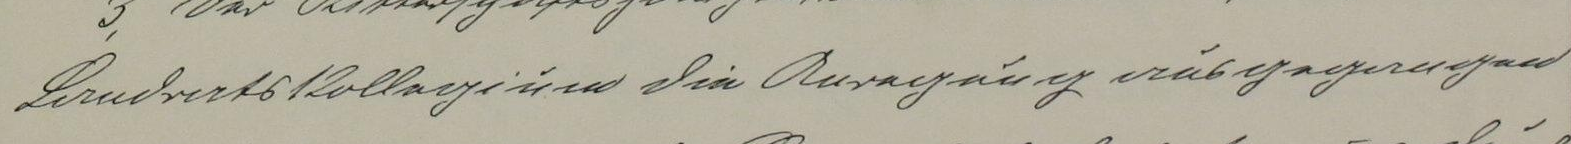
Landratskollegium die Anregung ausgegangen
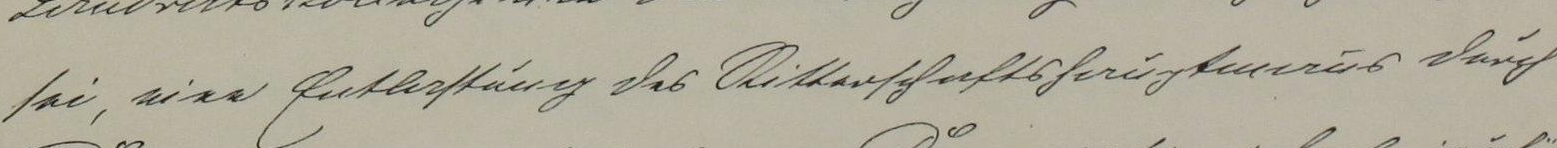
sei, eine Entlastung des Ritterschaftshauptmanns durch
